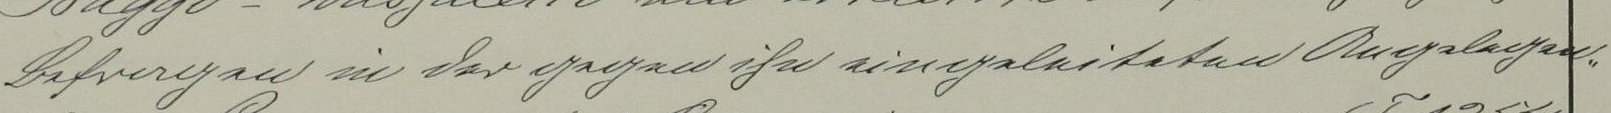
Befragen in der gegen ihn eingeleiteten Angelegen-
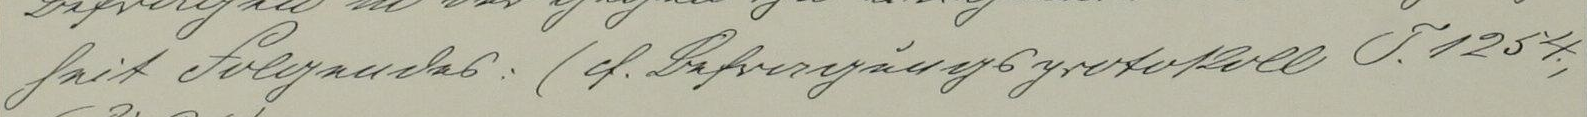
heit Folgendes: (cf. Befragungsprotokoll T.1254,
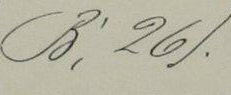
B.26).
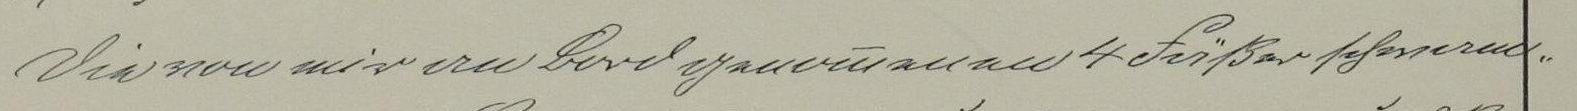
Die von mir an Bord genommenen 4 Fäßer schwam-
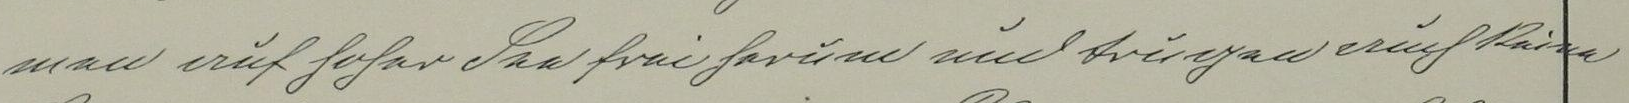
men auf hoher See frei herum und trugen auch keine
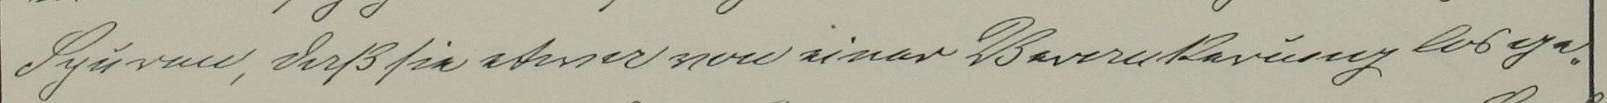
Spuren, daß sie etwa von einer Verankerung losge-
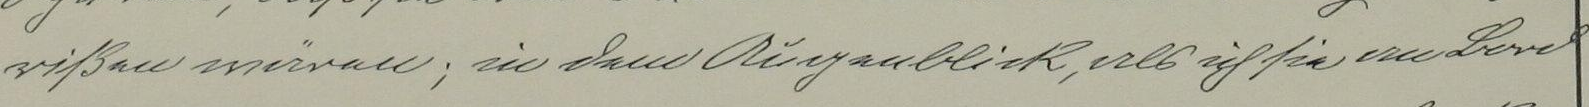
rißen wären; in dem Augenblick, als ich sie an Bord
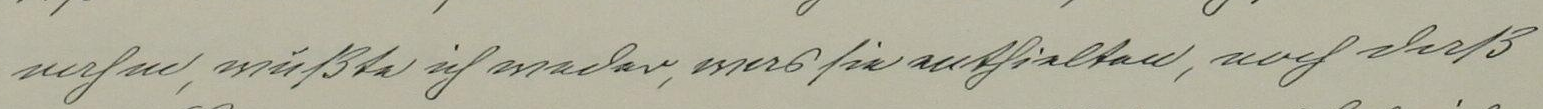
nahm, wußte ich weder, was sie enthielten, noch daß
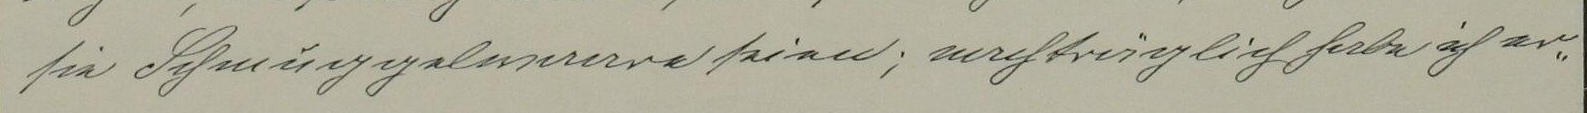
sie Schmuggelwaare seien; nachträglich habe ich er-
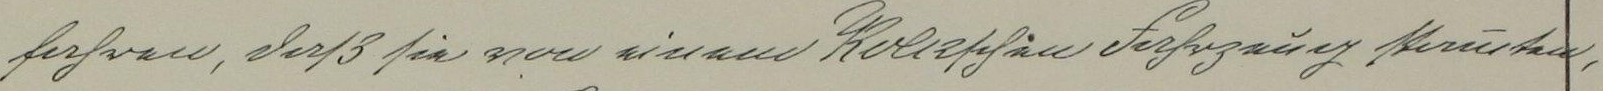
fahren, daß sie von einem Kolkschen Fahrzeug stammten,
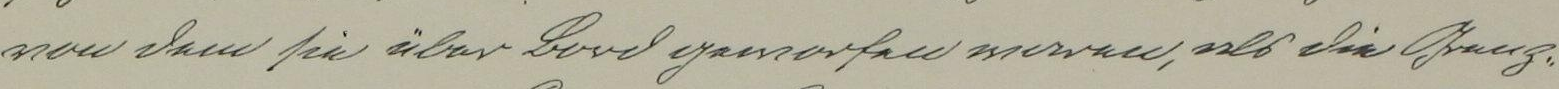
von dem sie über Bord geworfen waren, als die Grenz-
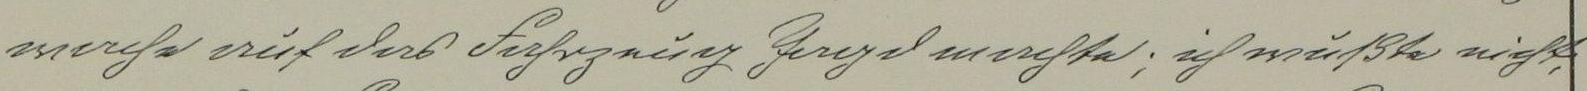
wache auf das Fahrzeug Jagd machte; ich wußte nicht,
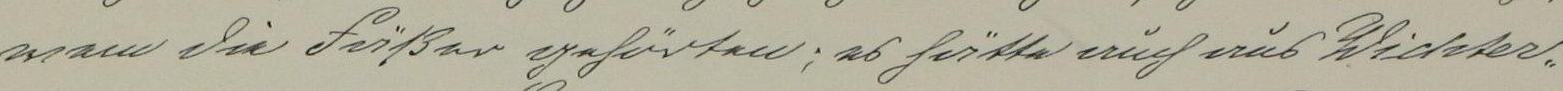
wem die Fäßer gehörten; es hätte auch aus Wichter-
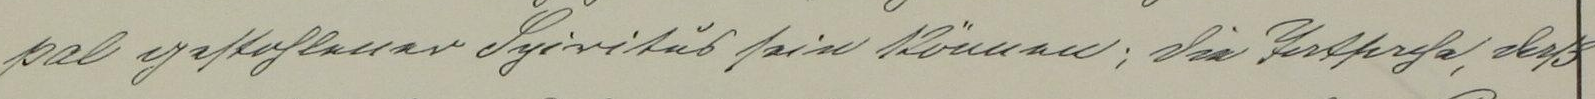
pal gestohlener Spiritus sein können; die Tatsache, daß
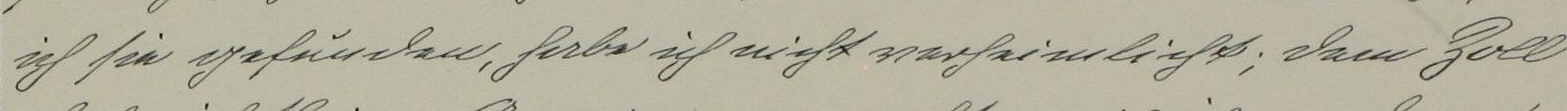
ich sie gefunden, habe ich nicht verheimlicht; dem Zoll
